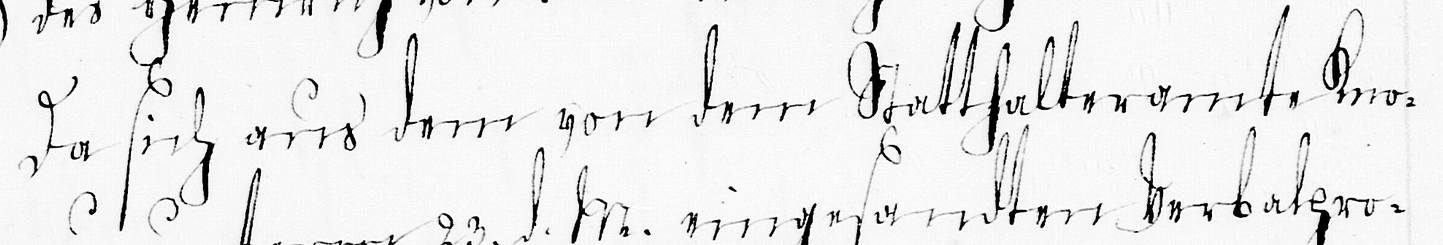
Da sich aus dem von dem Statthalteramte Kno¬
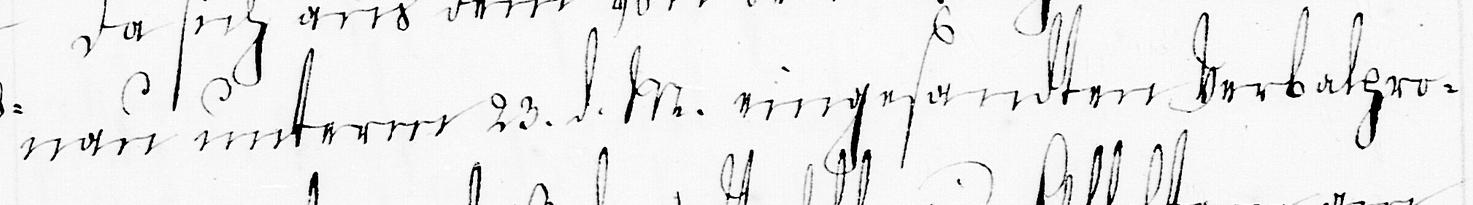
nau unterm 23. d. M. eingesandten Verbalpro¬
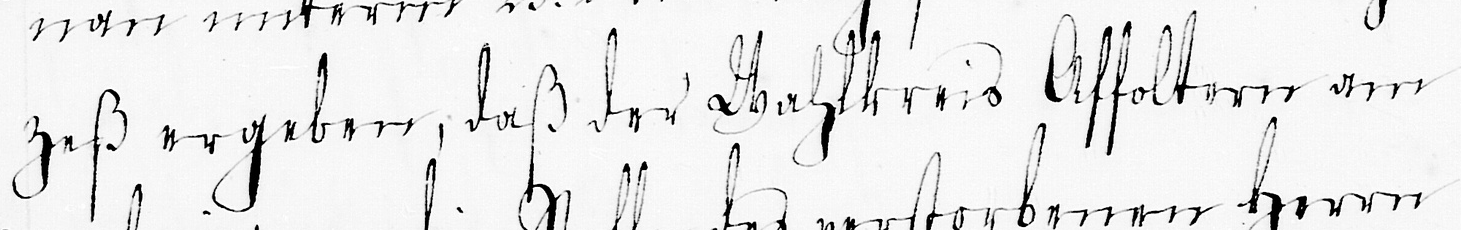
zeß ergeben, daß der Wahlkreis Affoltern am
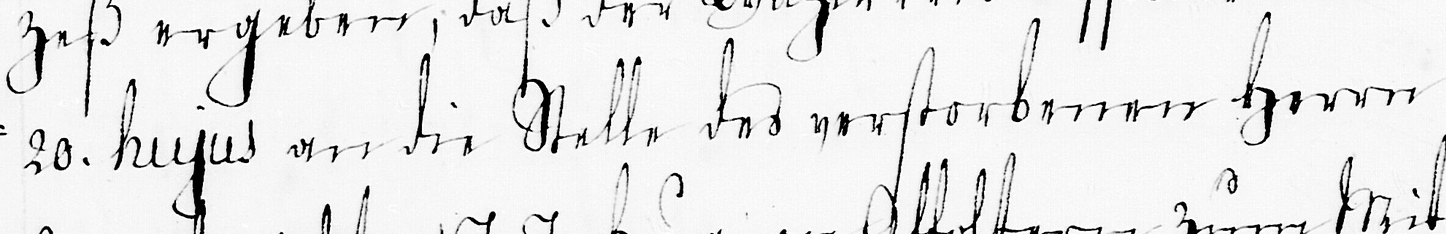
20. hujus an die Stelle des verstorbenen Herrn
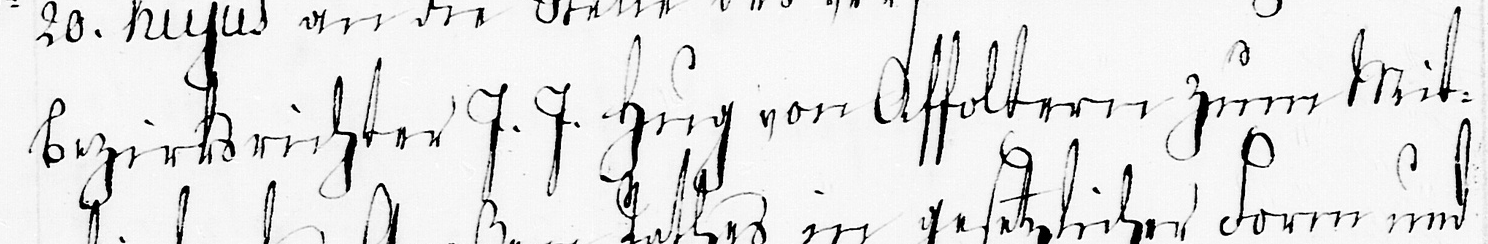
Bezirksrichter J. J. Hug von Affoltern zum Mit¬
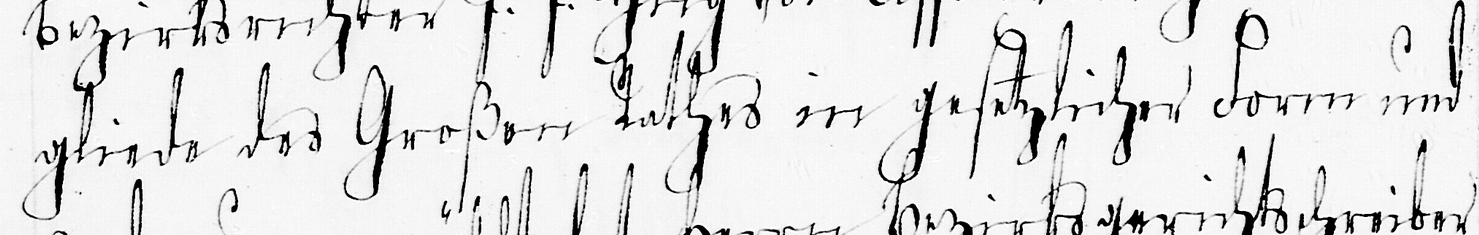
gliede des Großen Rathes in gesetzlicher Form und
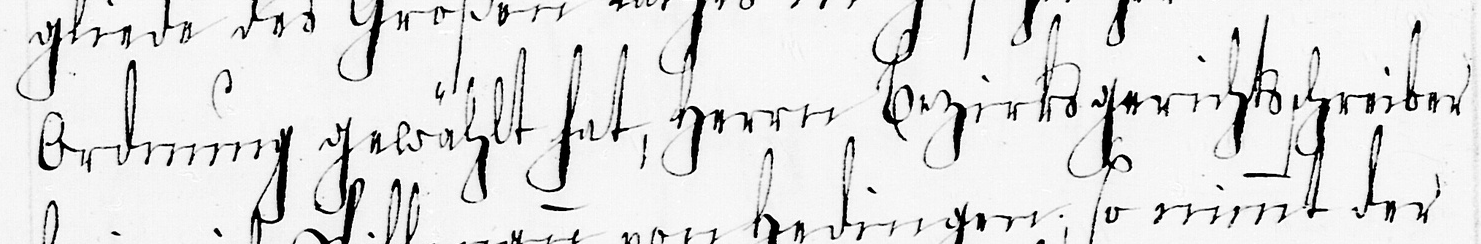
Ordnung gewählt hat, Herrn Bezirksgerichtsschreiber
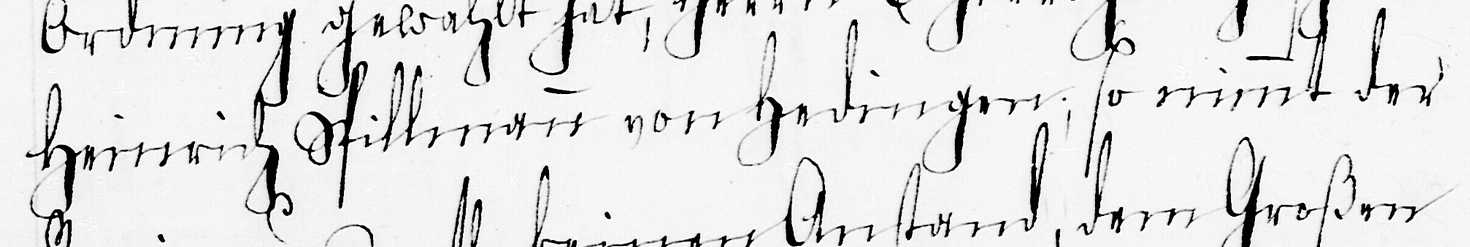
Heinrich Spillmann von Hedingen; so nimmt der
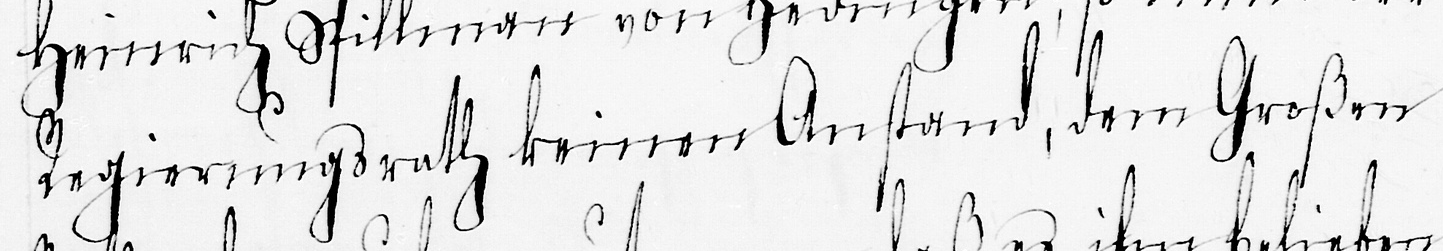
Regierungsrath keinen Anstand, dem Großen
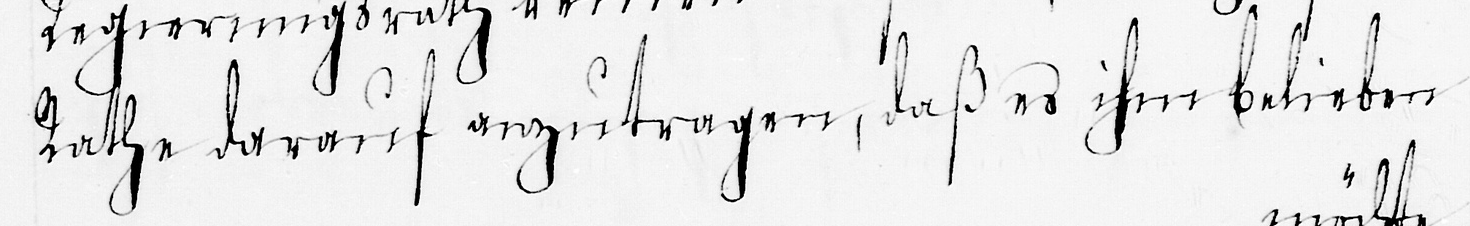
Rathe darauf anzutragen, daß es ihm belieben
